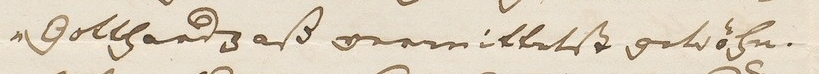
Gotthardpaß vermittelst gewöhn-
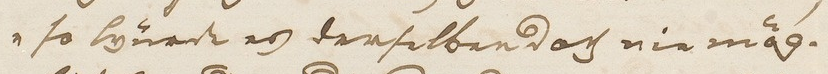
so würde es derselben doch nie mög-
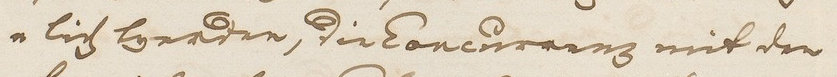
lich werden, die Concurrenz mit den
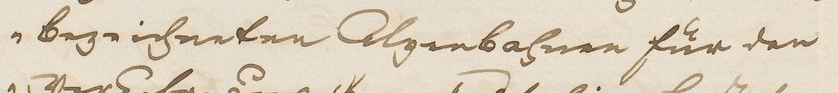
bezeichnetenAlpenbahnen für den
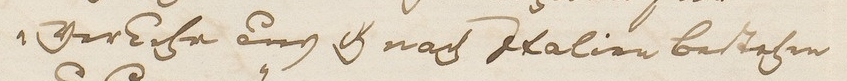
Verkehr aus & nach Italien bestehen
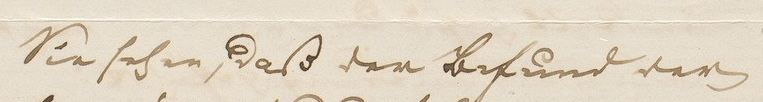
Sie sehen, daß der Befund der
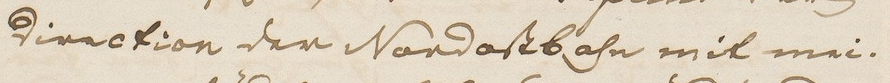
Direction der Nordostbahn mit mei-
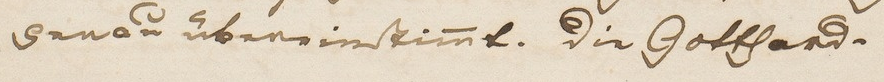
genau übereinstimmt. Die Gotthard -
